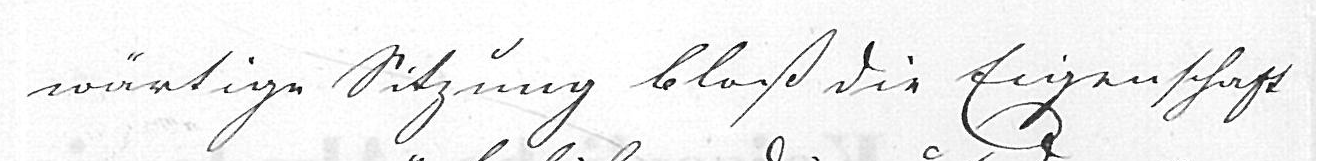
wärtige Sitzung bloß die Eigenschaft
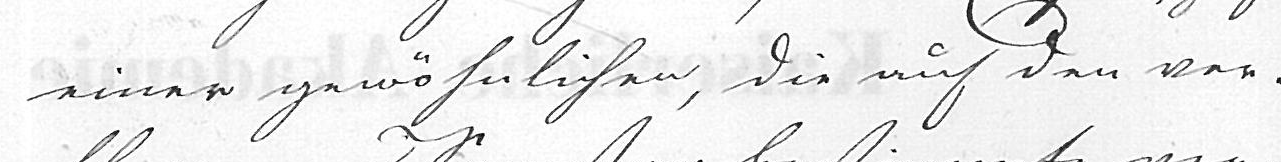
einer gewöhnlichen, die auch den ver-
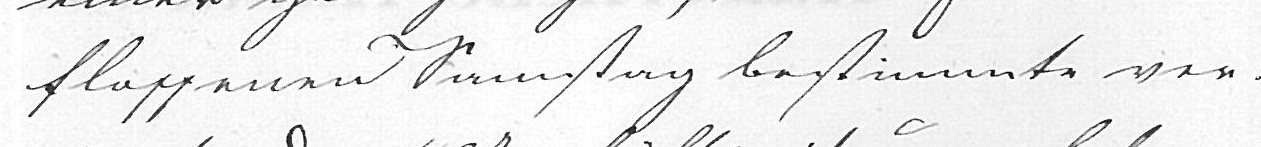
flossenen Samstag bestimmte ver-
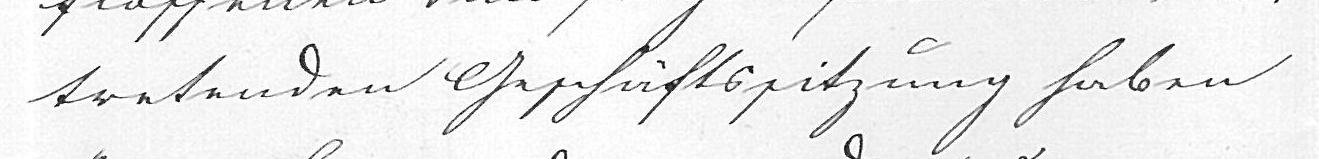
tretenden Gesschäftssitzung haben
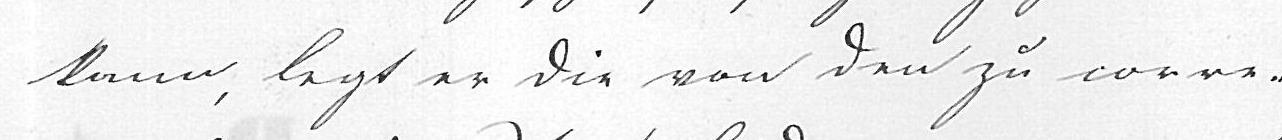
kann, legt er die von den zu corre-
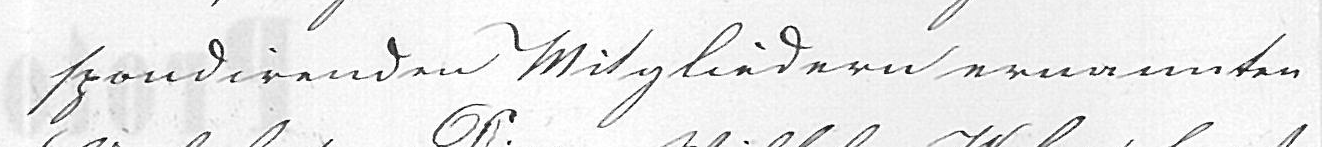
spondirenden Mitgliedern ernannten
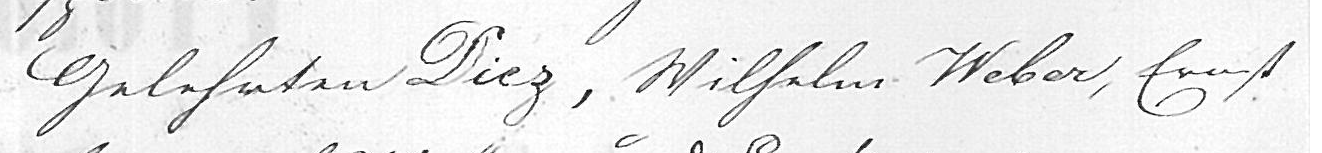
Gelehrten Diez, Wilhelm Weber, Ernst
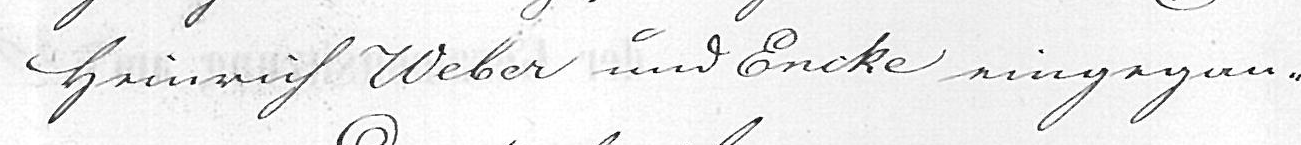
Heinrich Weber und Encke eingegan-
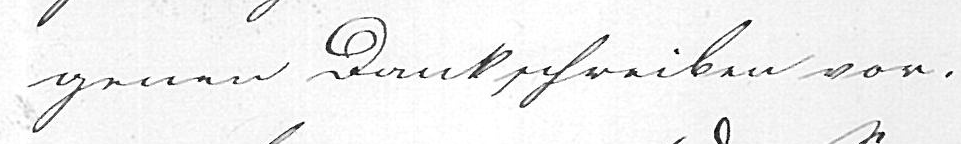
genen Dankschreiben vor.
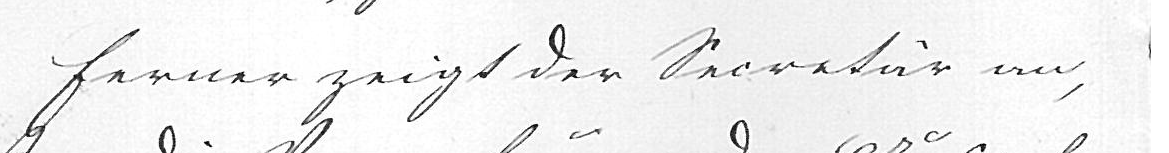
Ferner zeigt der Secretär an,
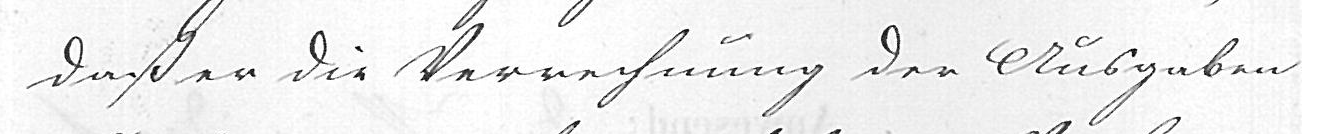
daß er die Verrechnung der Ausgaben
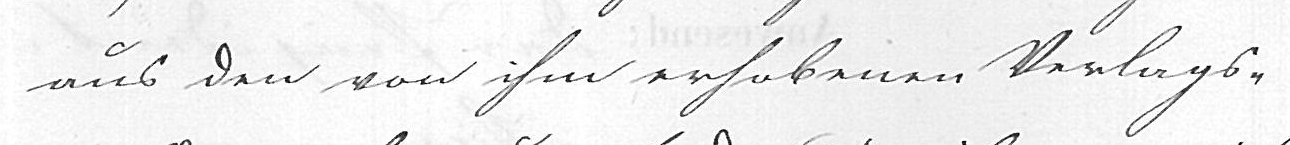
aus den von ihm erhobenen Verlags-
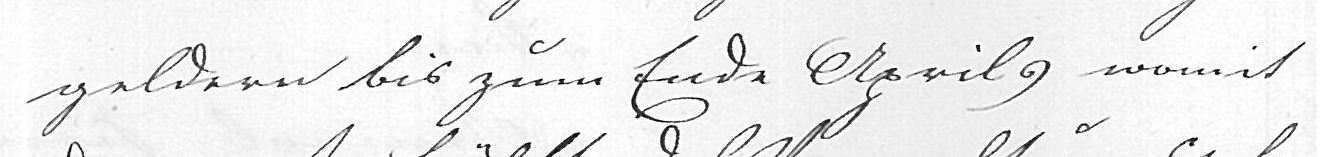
geldern bis zum Ende Aprils womit
